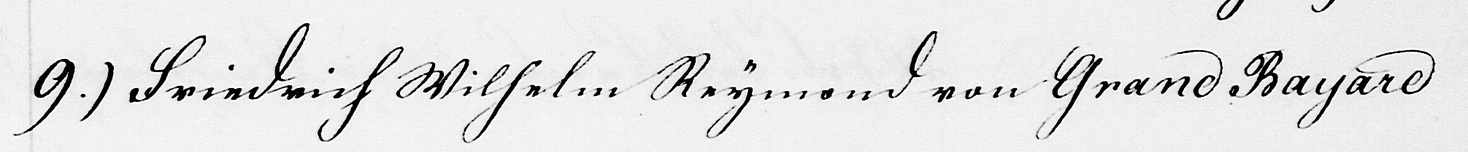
9.) Friedrich Wilhelm Reymond von Grand Bayard
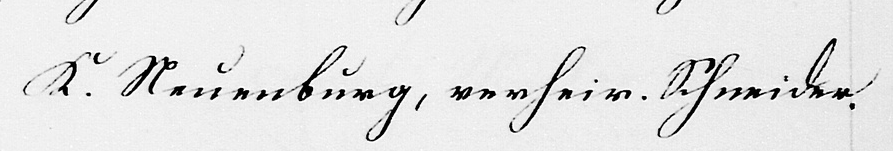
K. Neuenburg, verheir. Schneider.
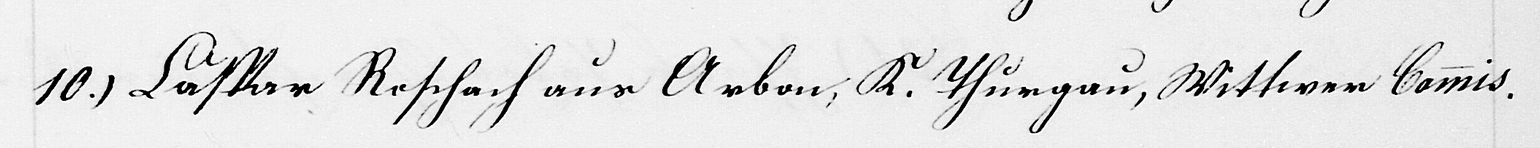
10.) Caspar Roschach aus Arbon, K. Thurgau, Wittwer Commis.
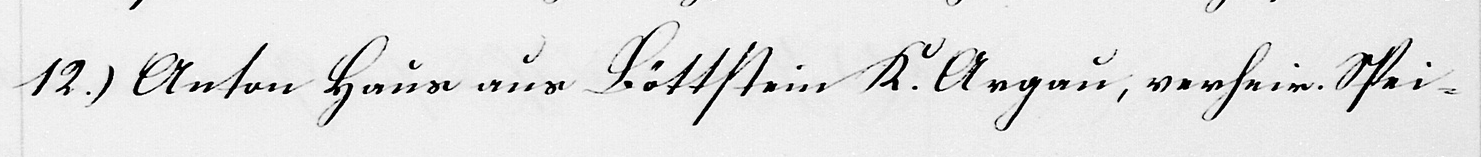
12.) Anton Haus aus Böttstein K. Argau, verheir. Spei¬
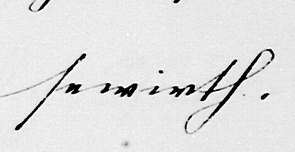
sewirth.
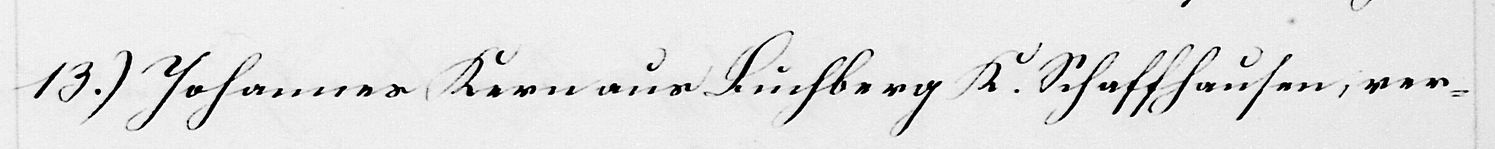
13.) Johannes Kern aus Buchberg K. Schaffhausen, ver¬
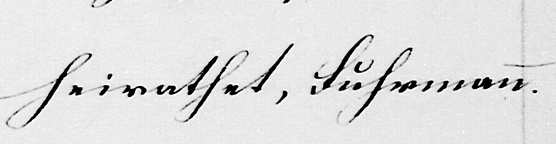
heirathet, Fuhrmann.
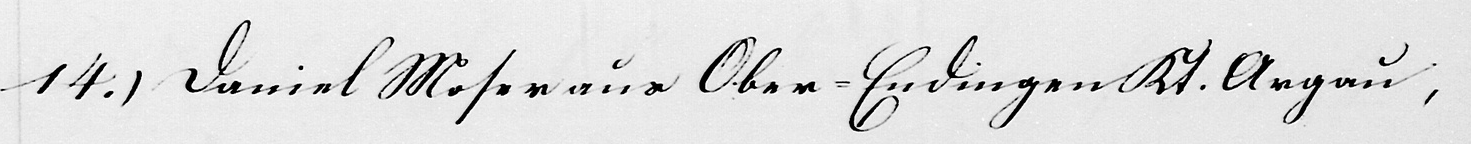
14.) Daniel Moser aus Ober-Endingen Kt. Argau,
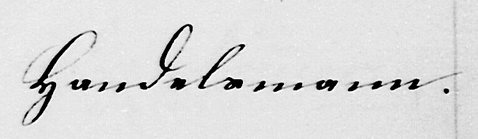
Handelsmann.
